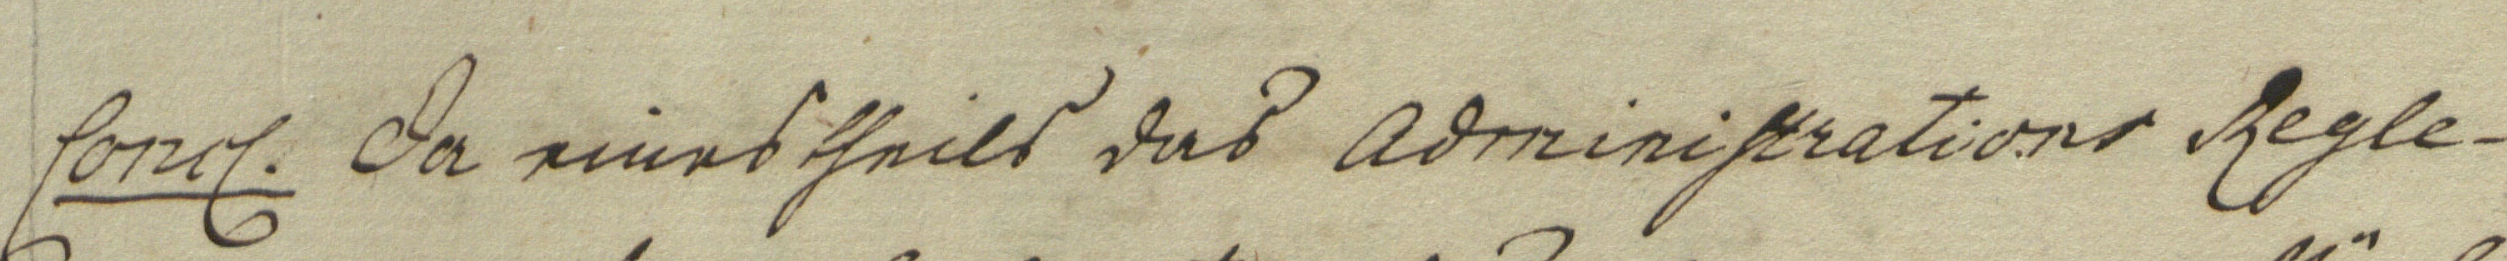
Concl. Da eines theils das Administrations Regle¬
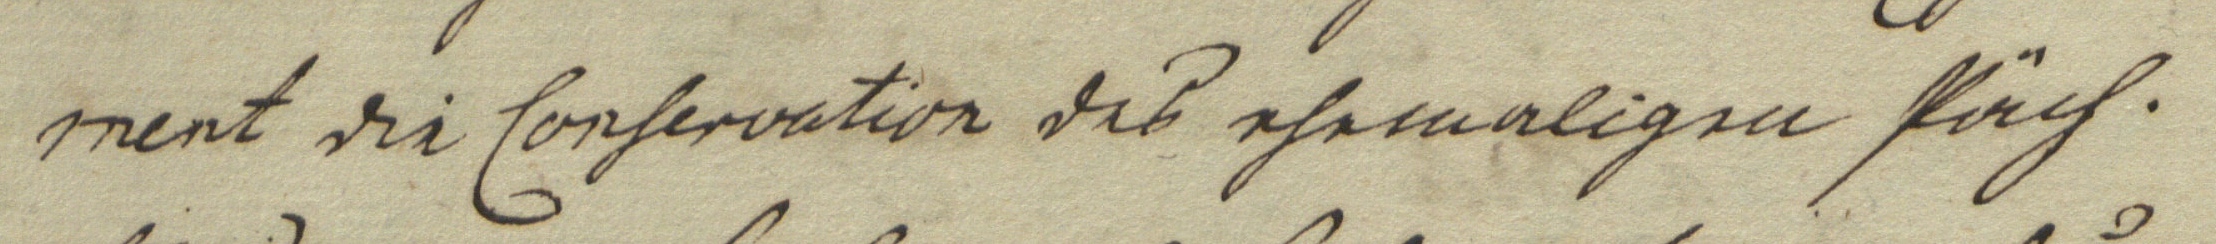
ment die Conservation des ehemaligen Päch¬
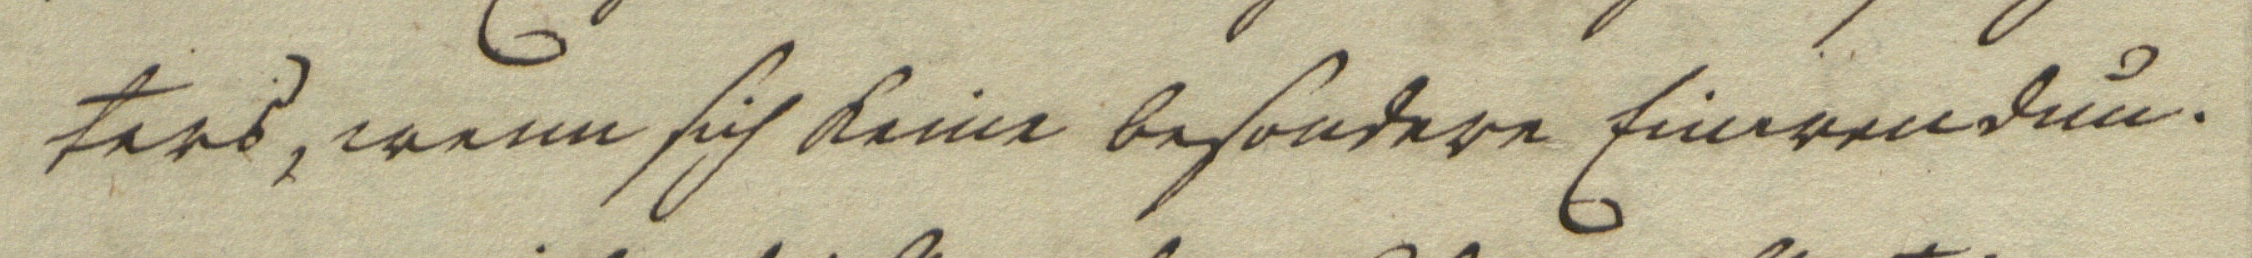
ters, wenn sich keine besondere Einwendun¬
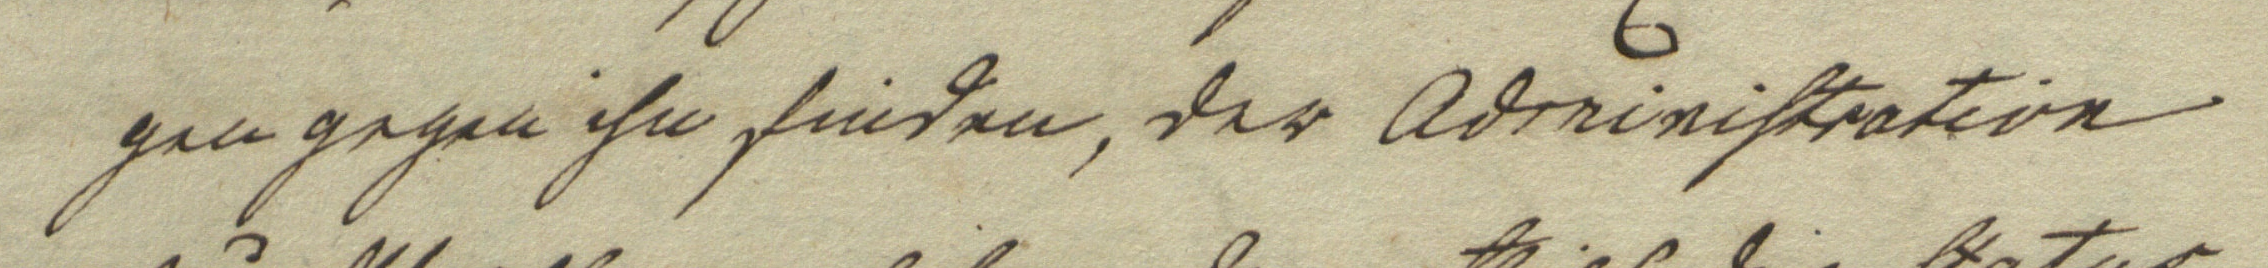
gen gegen ihn finden, der Administration
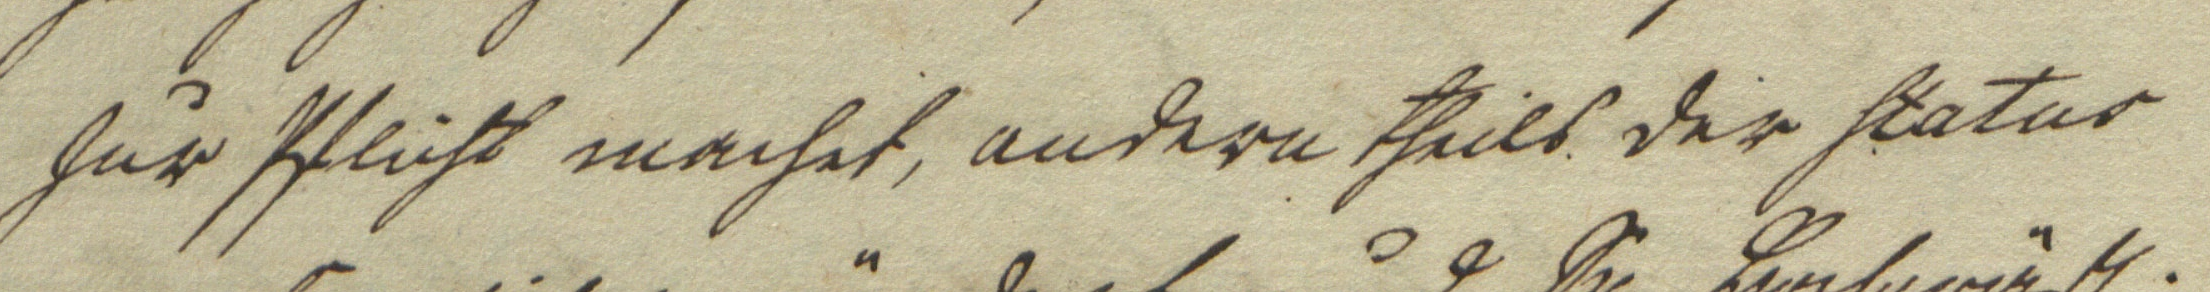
zur Pflicht machet, andern theils der status
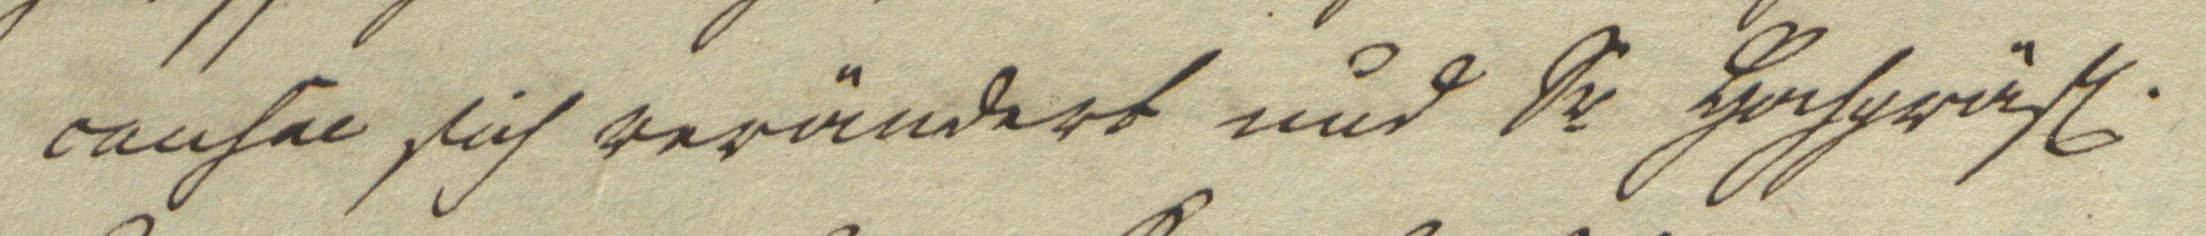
causae sich verändert und Sr Hochgräfl.
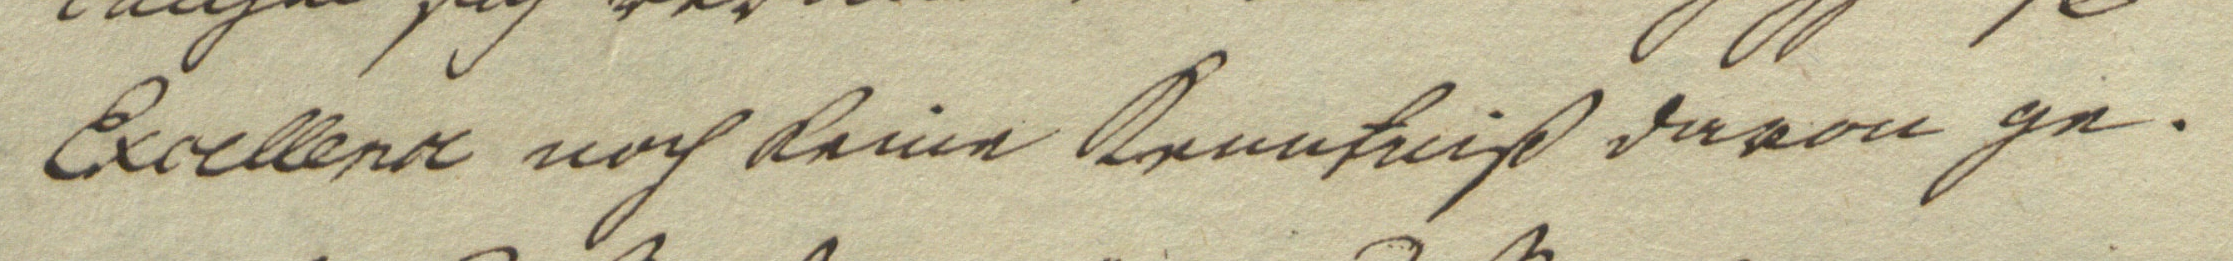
Excellence noch keine Kenntniß davon ge¬
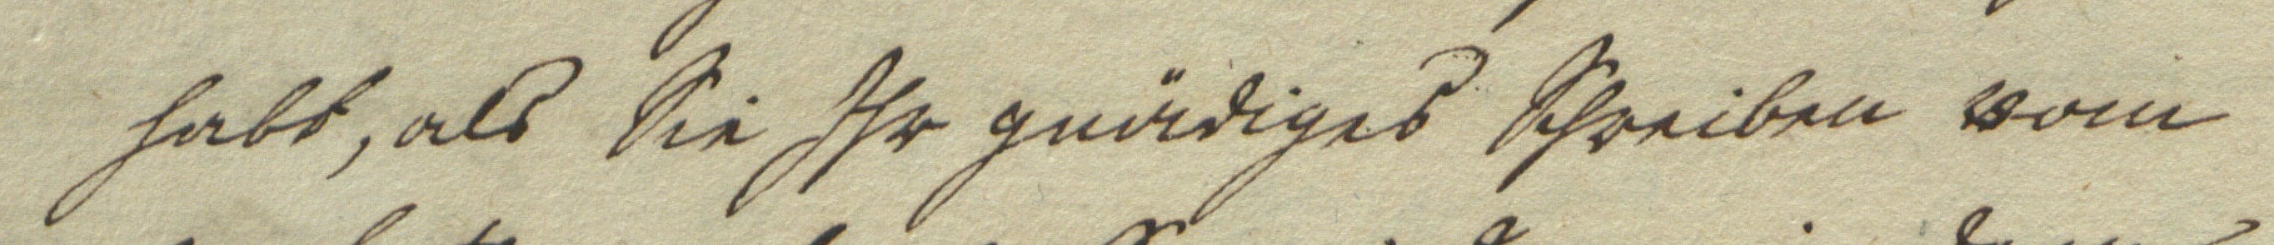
habt, als Sie Ihr gnädiges Schreiben vom
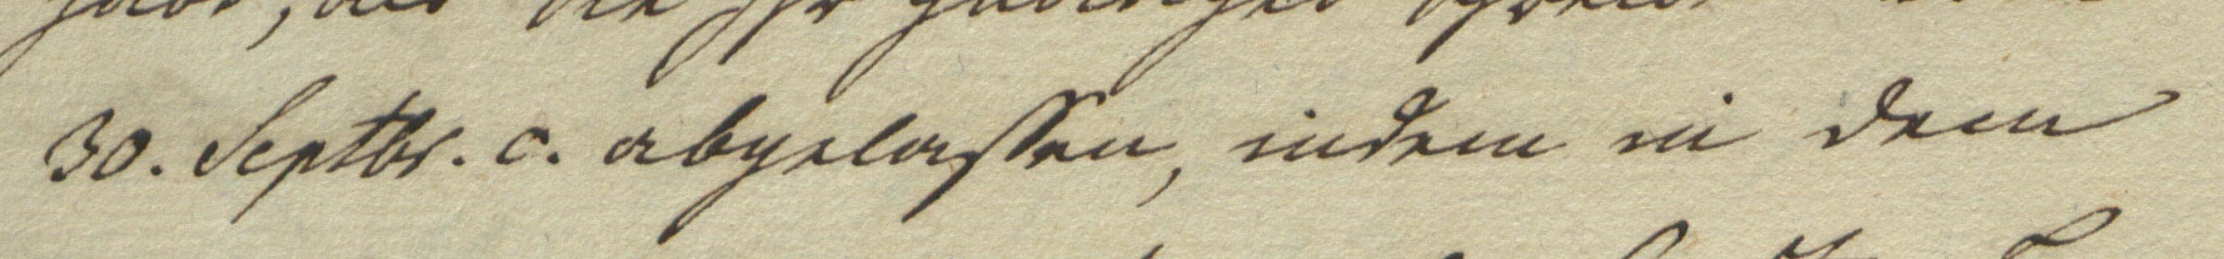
30. Septbr. c. abgelassen, indem in dem
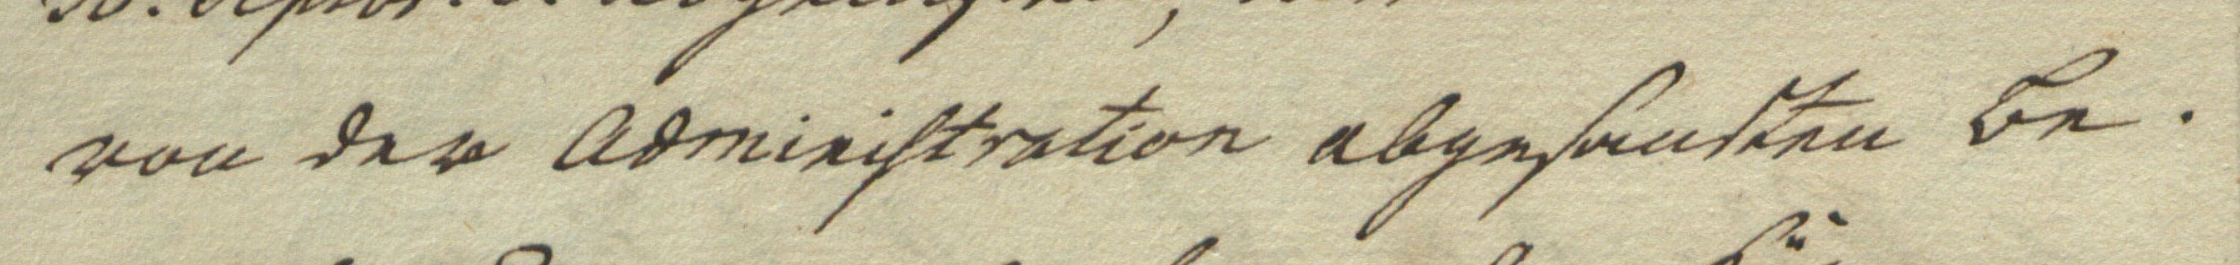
von der Administration abgesandten Be¬
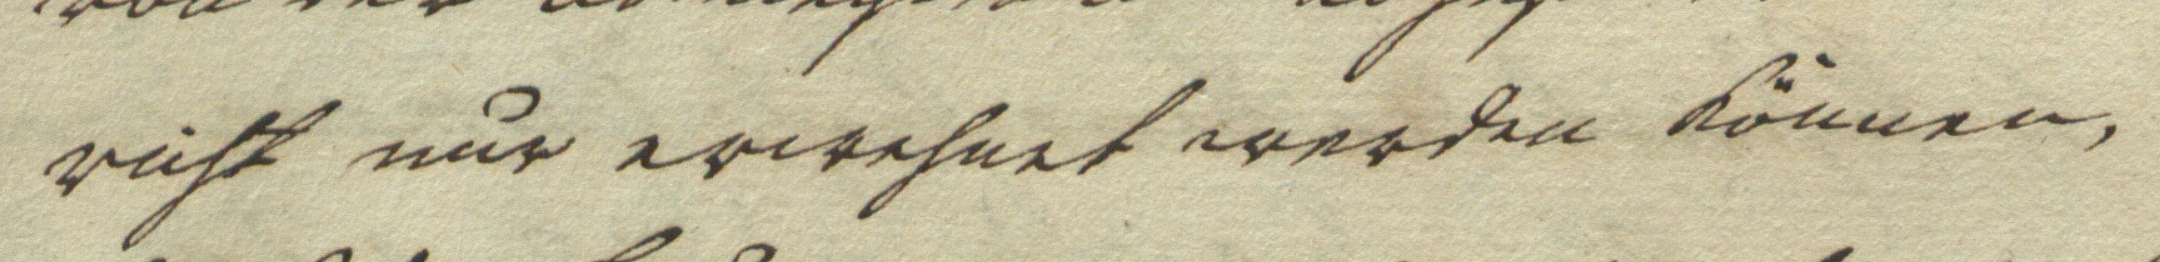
richt nur erwehnet werden können,
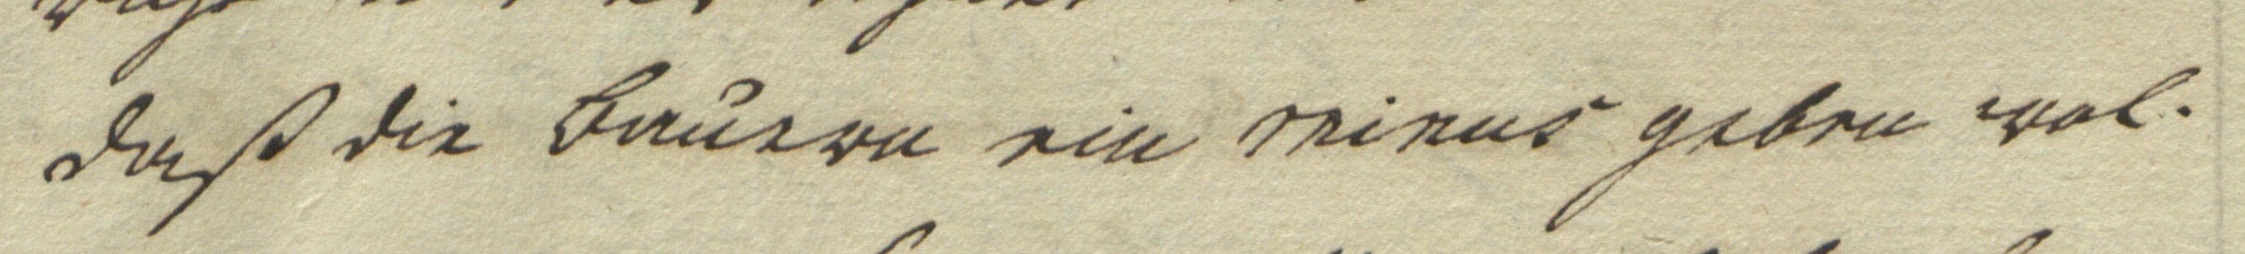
daß so die Bauern ein minus geben wol¬
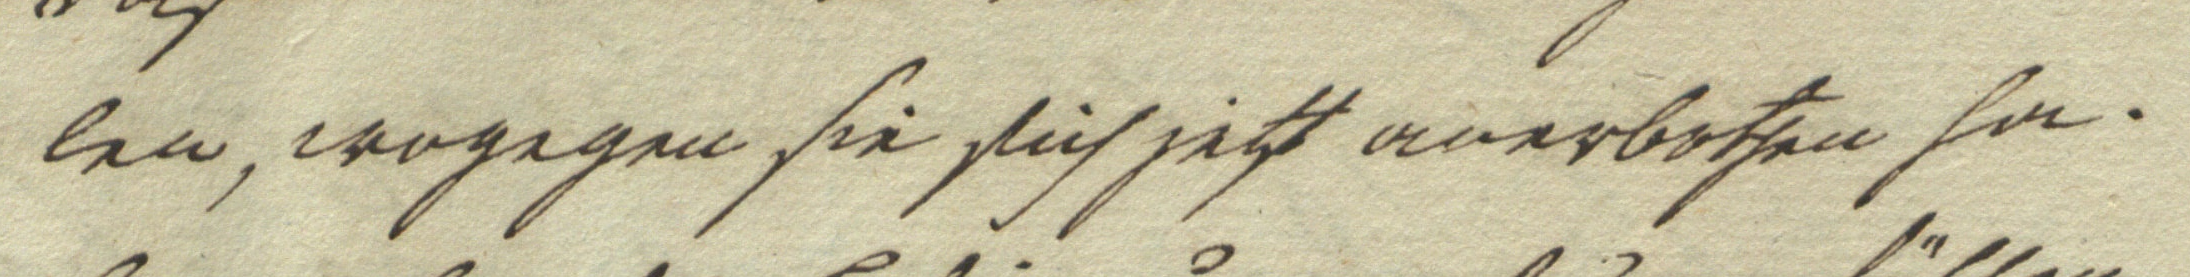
len, wogegen sie sich jetzt anerbothen ha¬
